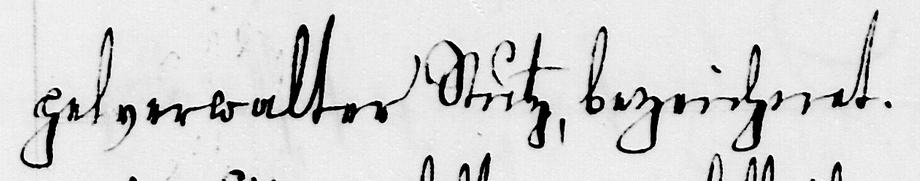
pelverwalter Stutz, bezeichnet.
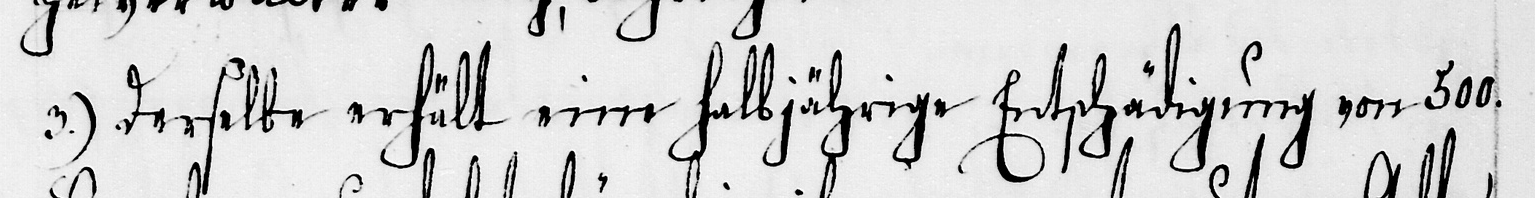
3.) Derselbe erhält eine halbjährige Entschädigung von 500.
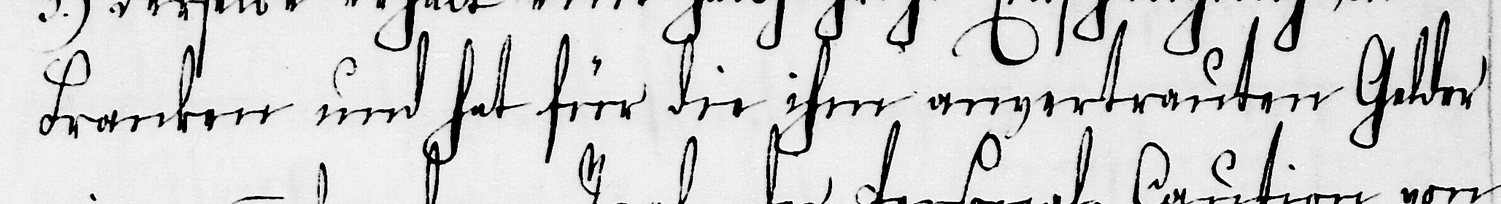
Franken und hat für die ihm anvertrauten Gelder
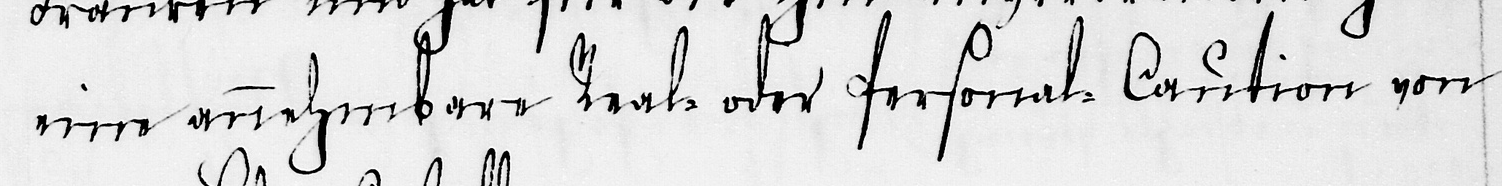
eine annehmbare Real- oder Personal-Caution von
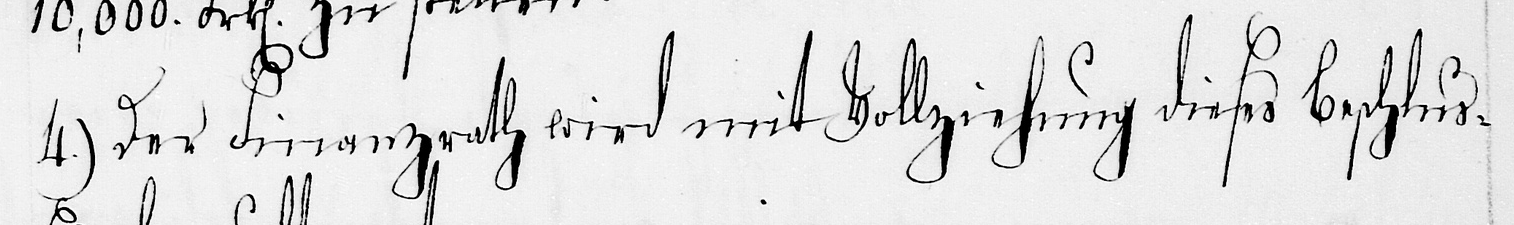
4.) Der Finanzrath wird mit Vollziehung dieses Beschluß¬
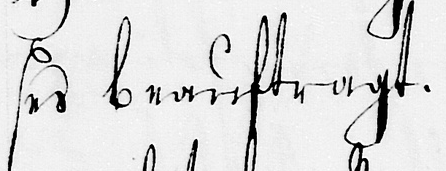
es beauftragt.
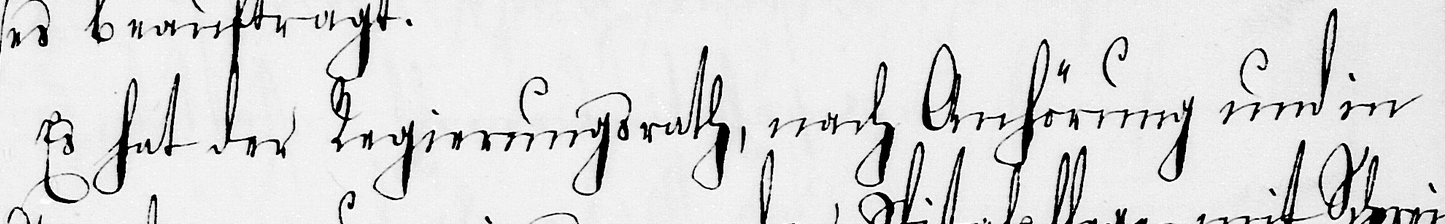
Es hat der Regierungsrath, nach Anhörung und in
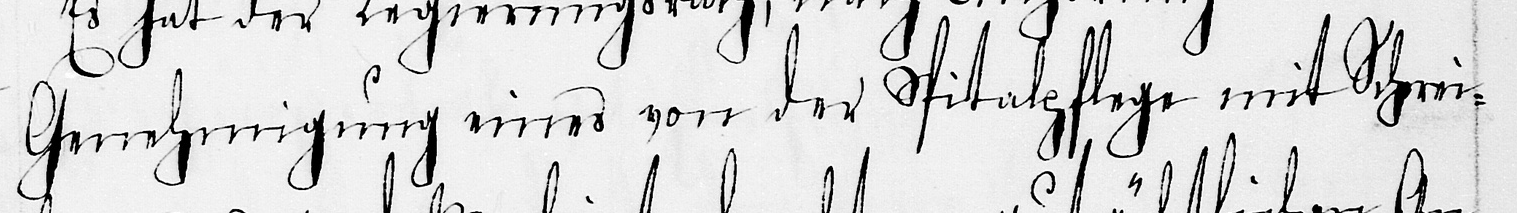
Genehmigung eines von der Spitalpflege mit Schrei¬
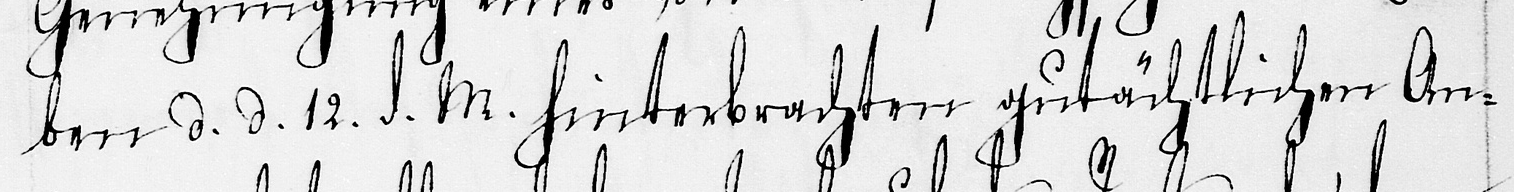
ben d. d. 12. d. M. hinterbrachten gutächtlichen An¬
